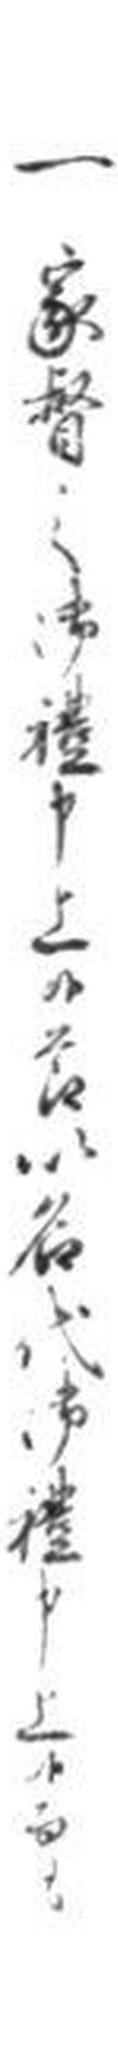一家督之御礼申上候節以名代御礼申上候而も
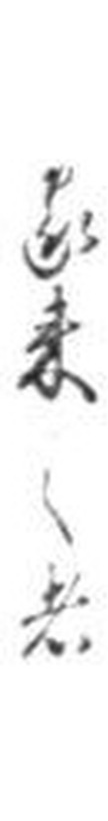家来之者
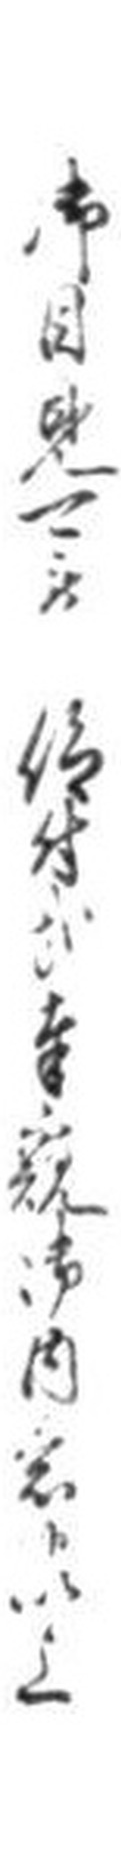御目見可被仰付哉奉窺御内意候以上
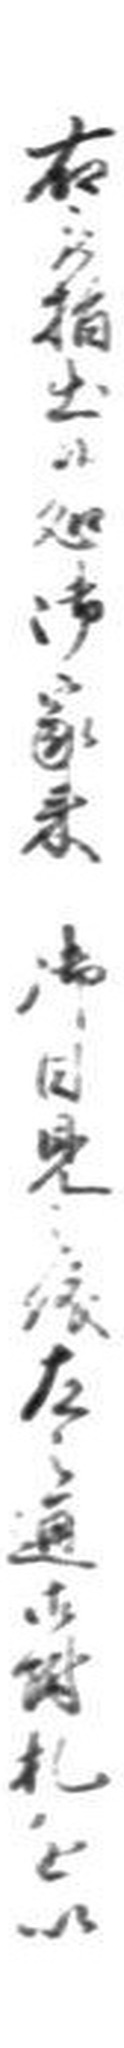右被指出候処御家来御目見之儀左之通御附札を以
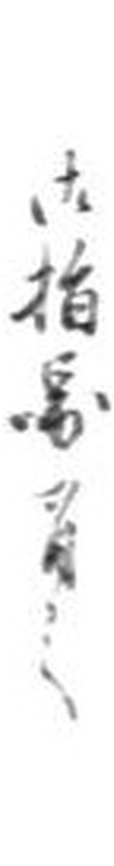御指図有之
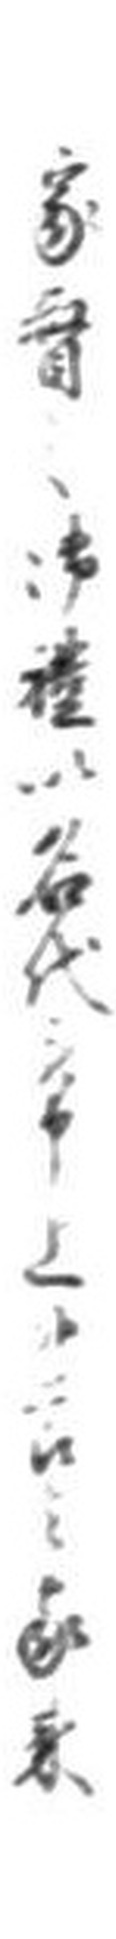家督之御礼以名代被申上候節之家来
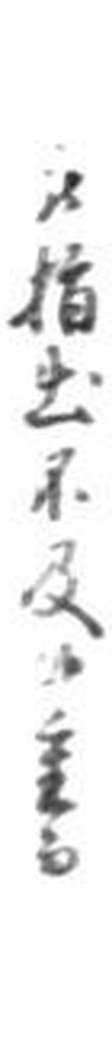被指出不及候重而
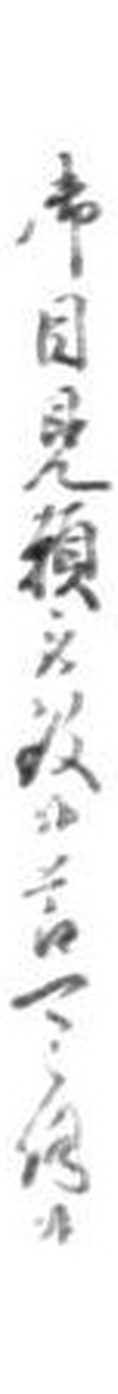御目見願被致候節可被伺候
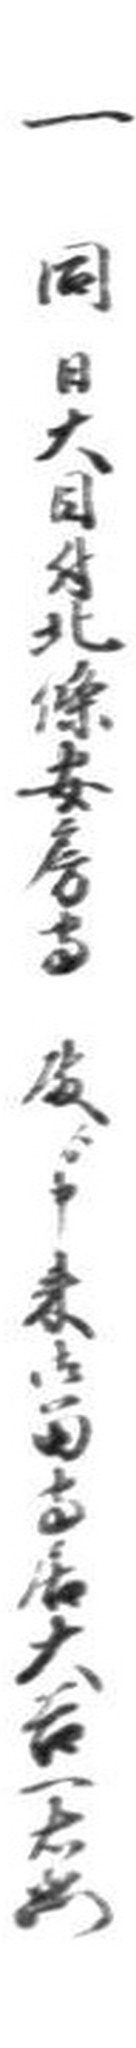一同日大目付北條安房守殿ゟ申来御留守居大谷一右衛門
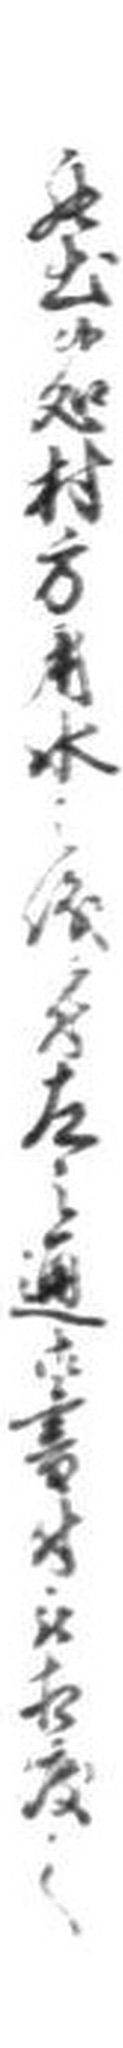罷出候処村方用水之儀ニ付左之通御書付被相渡之

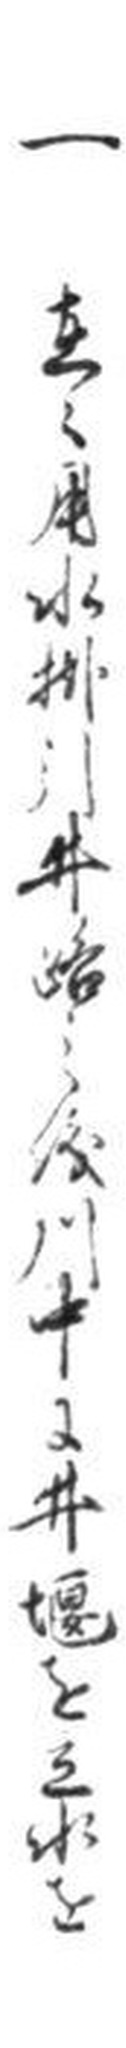一在々用水掛引井路之儀川中に井堰を立水を
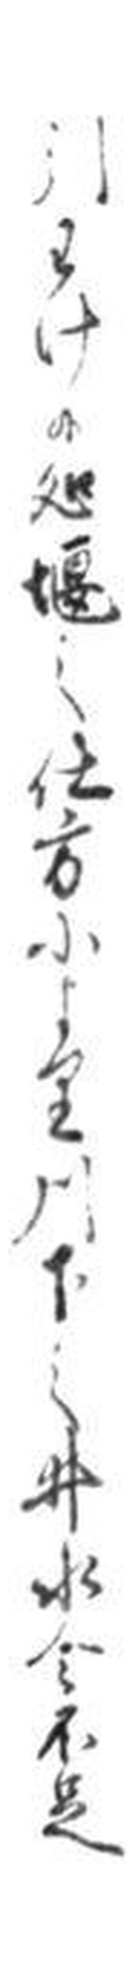引わけ候処堰之仕方により川下之井水令不足
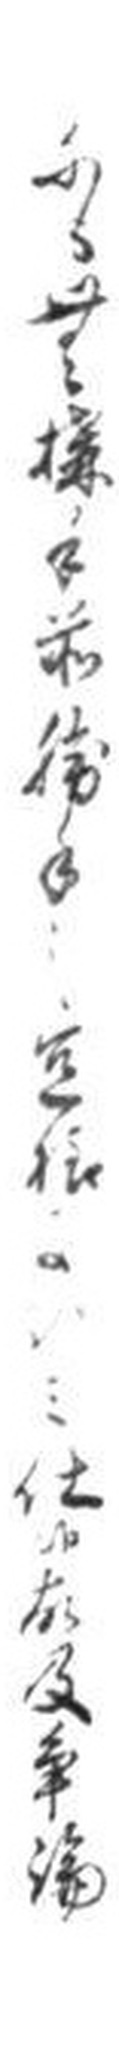にも無構手前勝手之宜様にのみ仕候故及争論
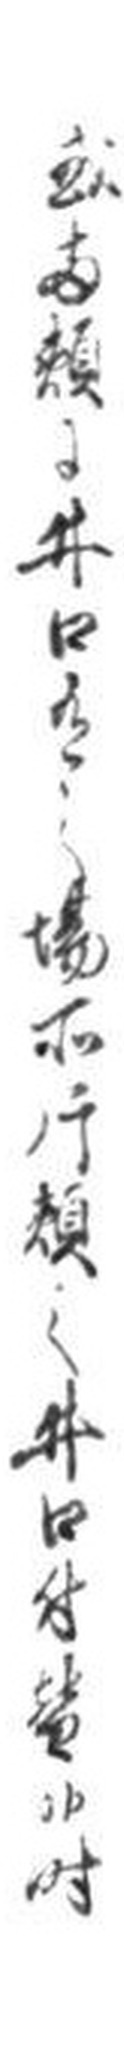或両頬に井口有之場所片頬之井口付替候時
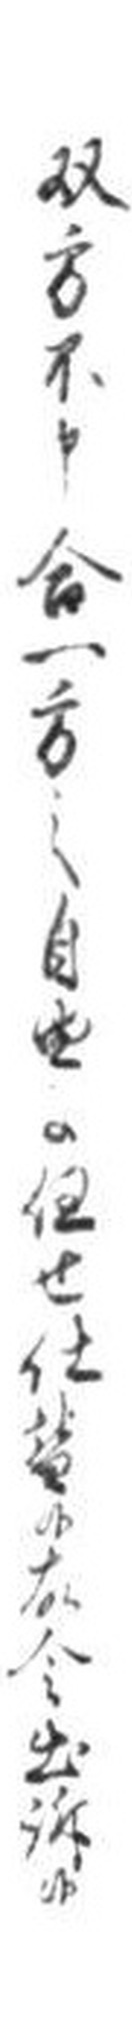双方不申合一方之自由に任せ仕替候故令出訴候
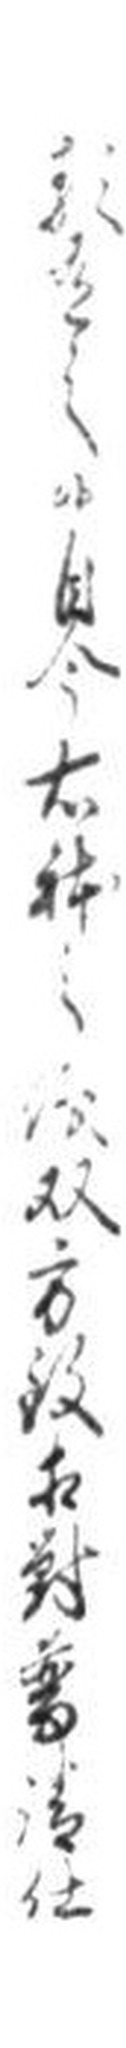類有之候自今右躰之儀双方致相対普請仕
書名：家譜 三十七 宗矩公 従正徳五年到享保九年五月
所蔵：福井県文書館 Fukui Prefectural Archives
